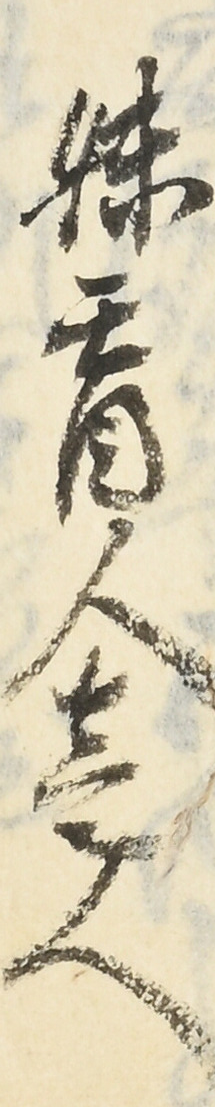妹盲人壱人
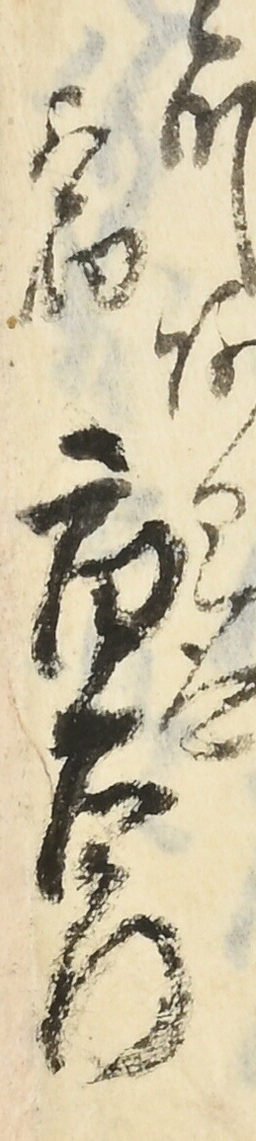宿市右衛門

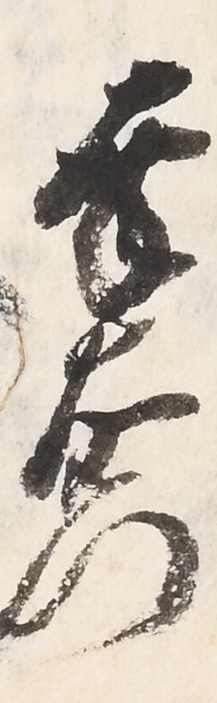平右衛門
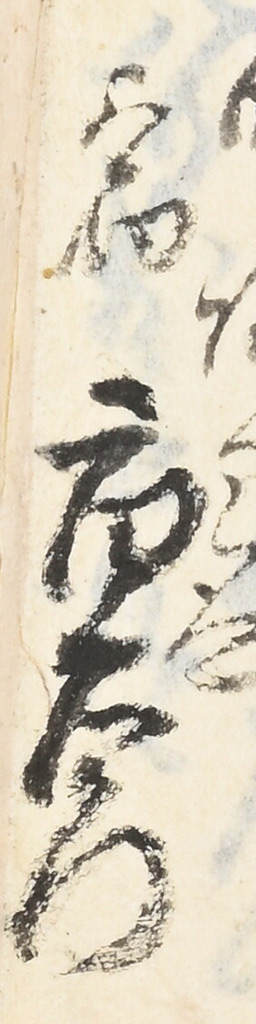宿金右衛門
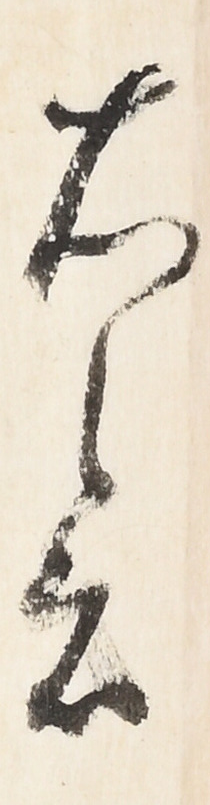右之者
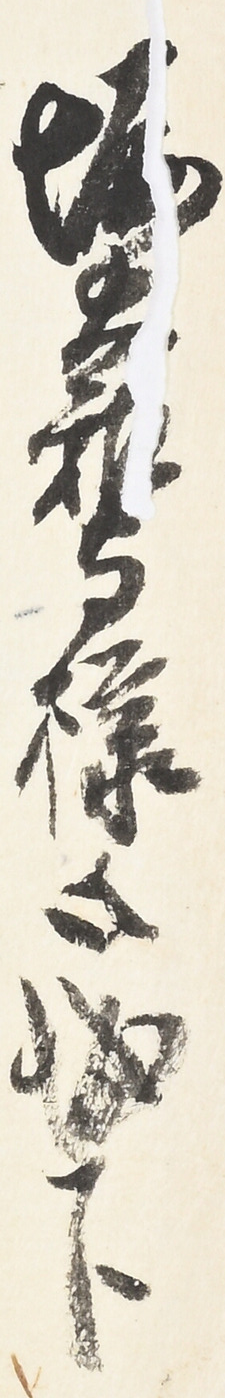堀大和守様御城下
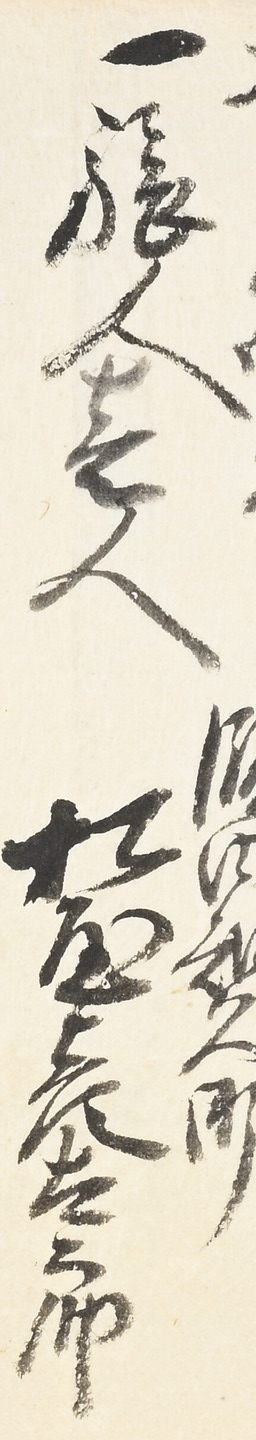一旅人壱人松屋彦太郎
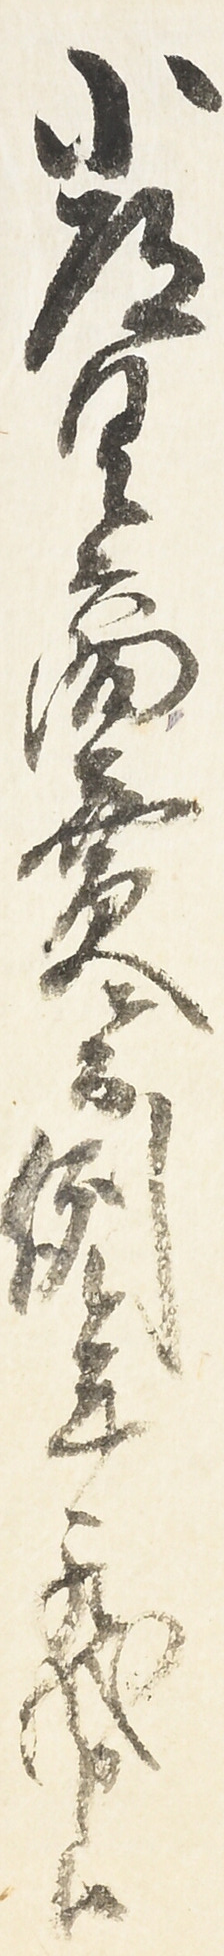小道具商売ニ而例年罷越申候
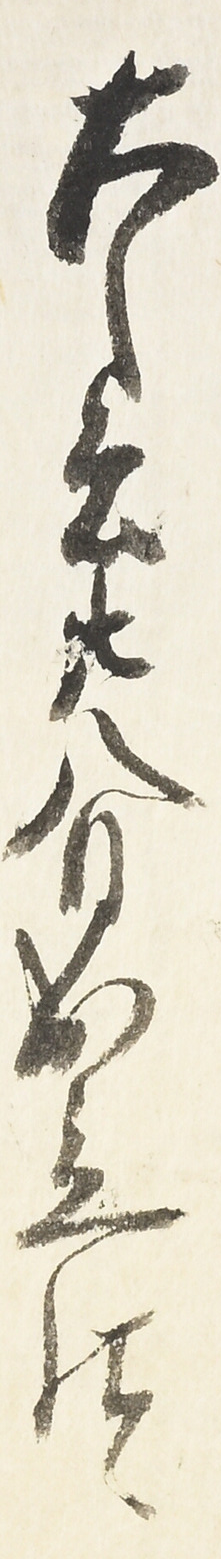右之者廿八日出立仕候
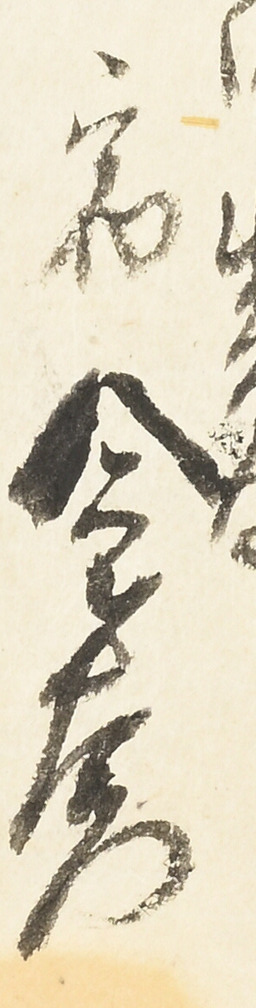宿金右衛門
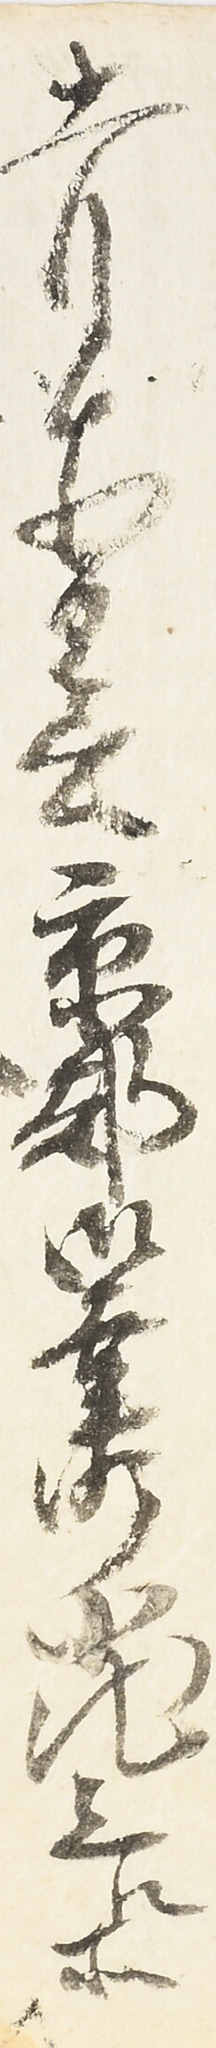十一月十五日着京都御幸町御池上ル所
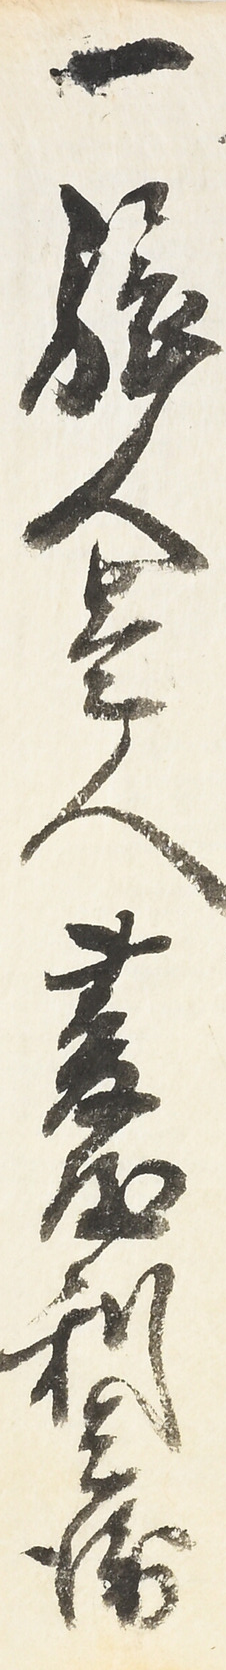一旅人壱人菱屋利兵衛
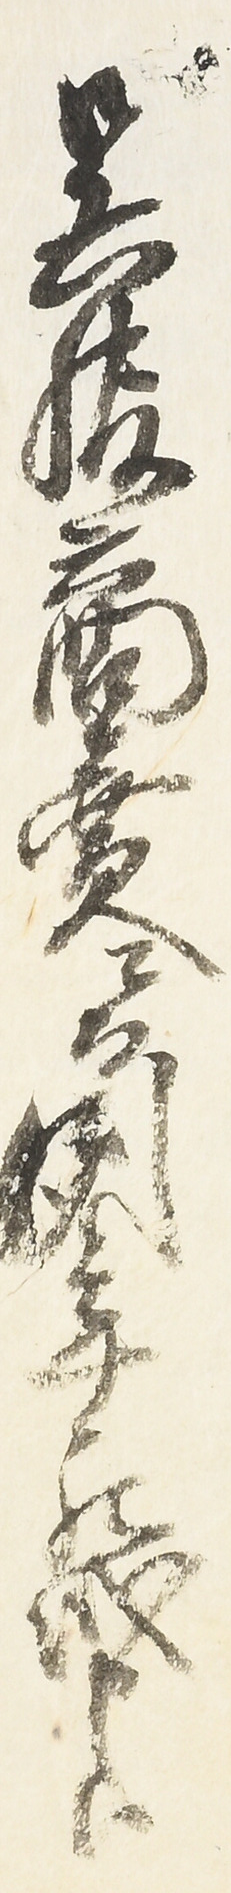呉服商売ニ而例年罷越申候
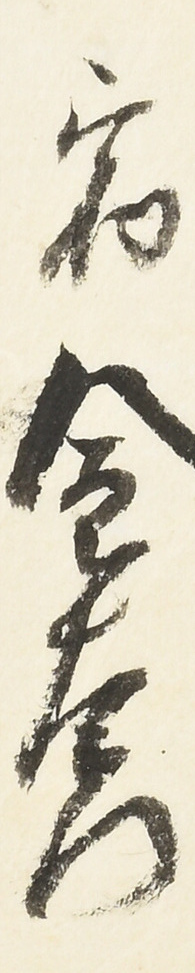宿金右衛門
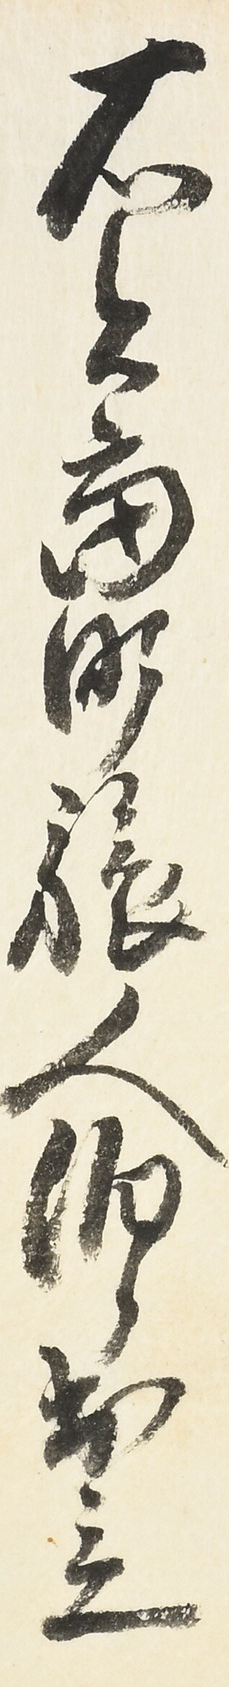右者当町旅人泊リ出立
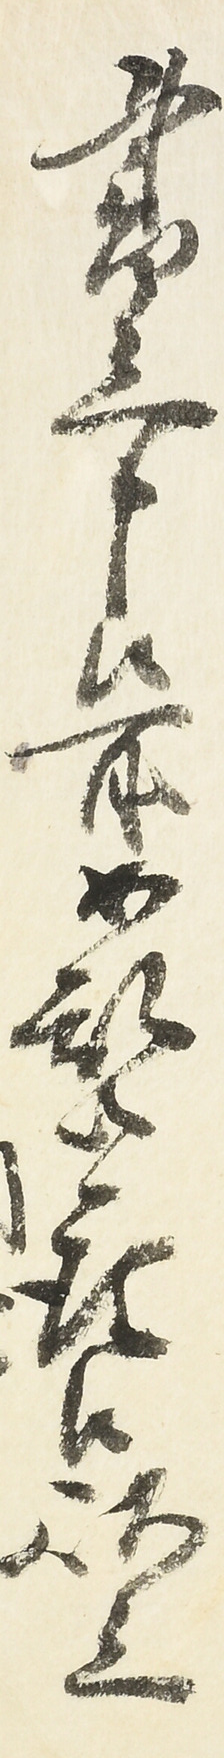書上申候所如斯御座候以上
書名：町中旅人泊控帳
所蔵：伊那市立高遠町図書館・合同会社AMANE
